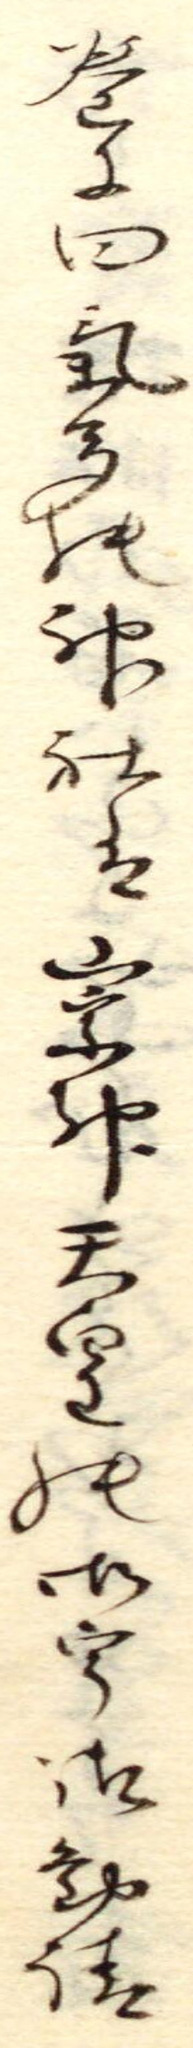巻に曰気多の神社は崇神天皇の御宇御勧請
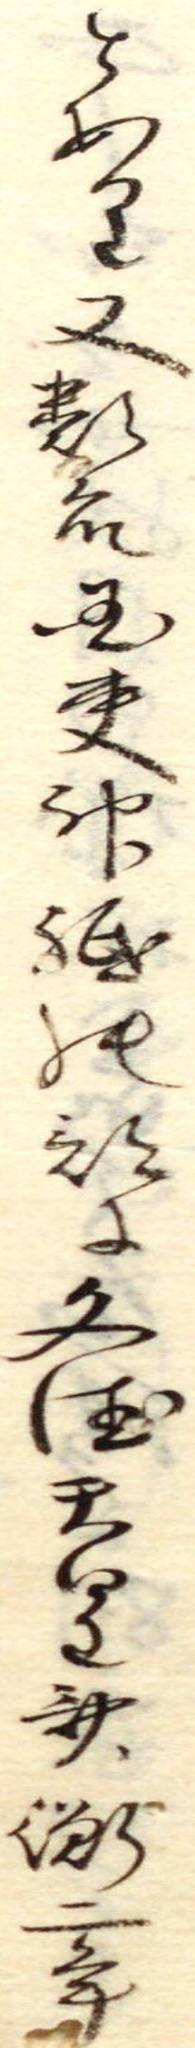とあり類衆国史神祇の部に文徳天皇斉衡二年
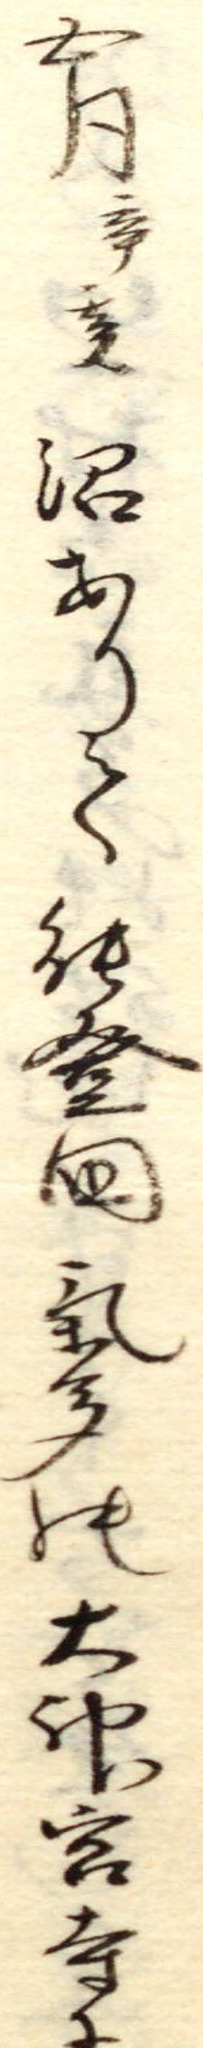五月辛亥詔ありて能登国気多の大神宮寺に
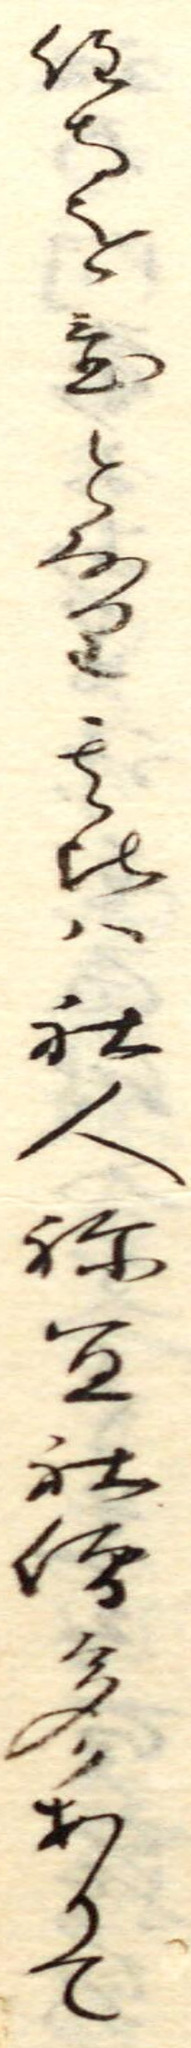住寺を置となり其比は社人祢宜社僧多くありて
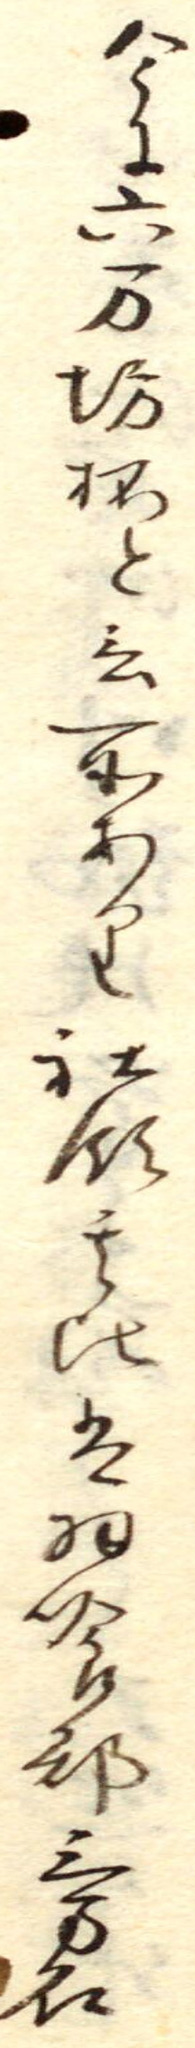今に六万坊抔と云所あり社領其比は羽喰郡三万石
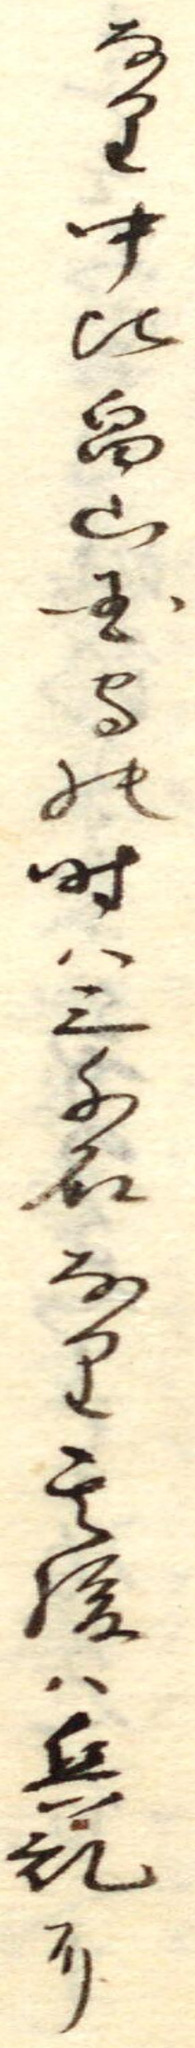なり中比畠山国守の時は三千石なり其後は兵乱に
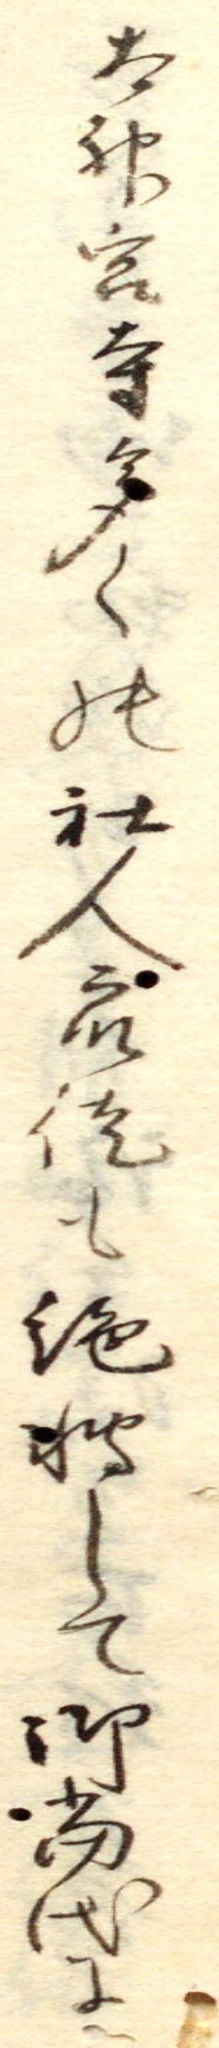太神宮寺多くの社人衆徒も絶転して御当代に
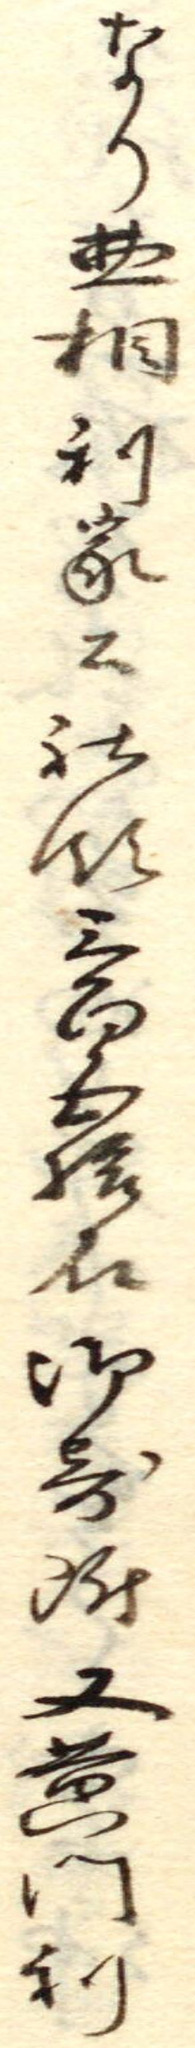なり亜相利家公社領三百五拾石御寄附又黄門利
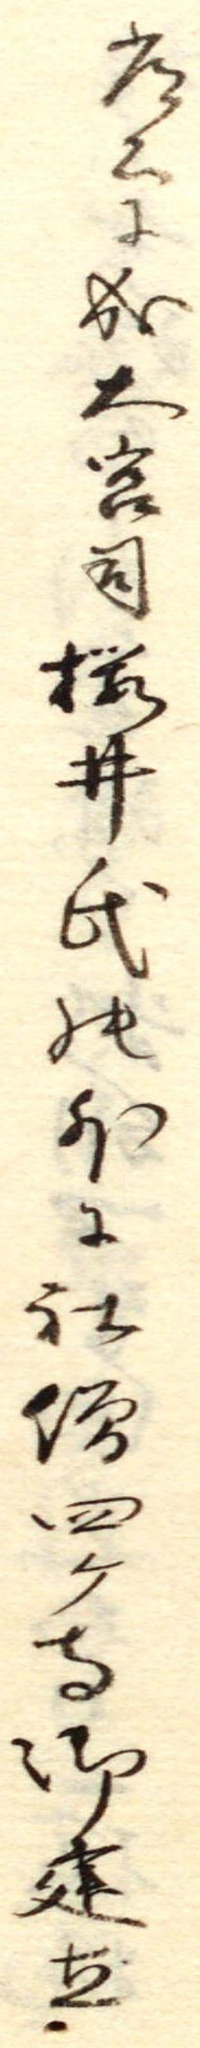常公に成大宮司桜井氏の外に社僧四ヶ寺御建立
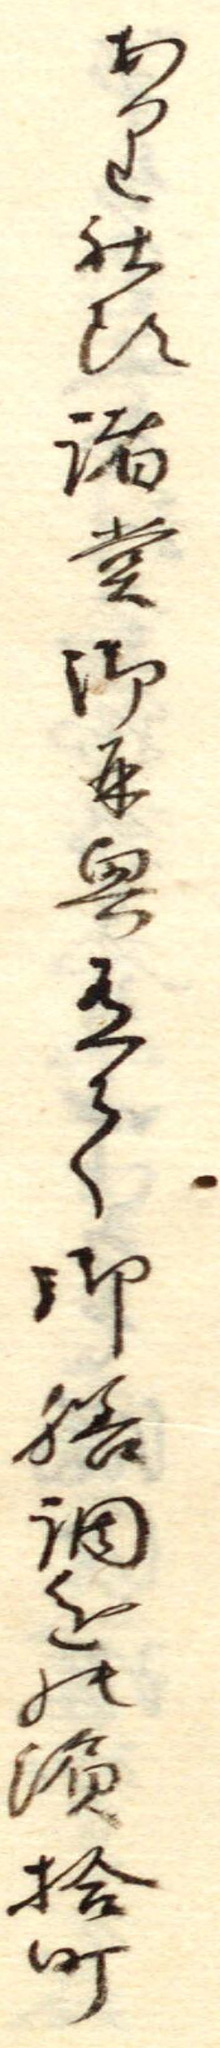あり社頭諸堂御再興有て御膳調進の濱拾町
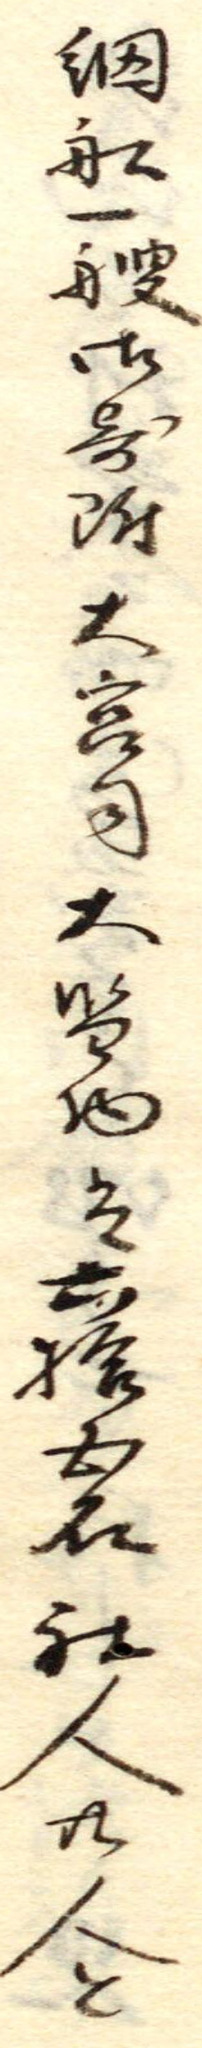細船一艘御寄附大宮司大監物は六拾五石社人廿人と
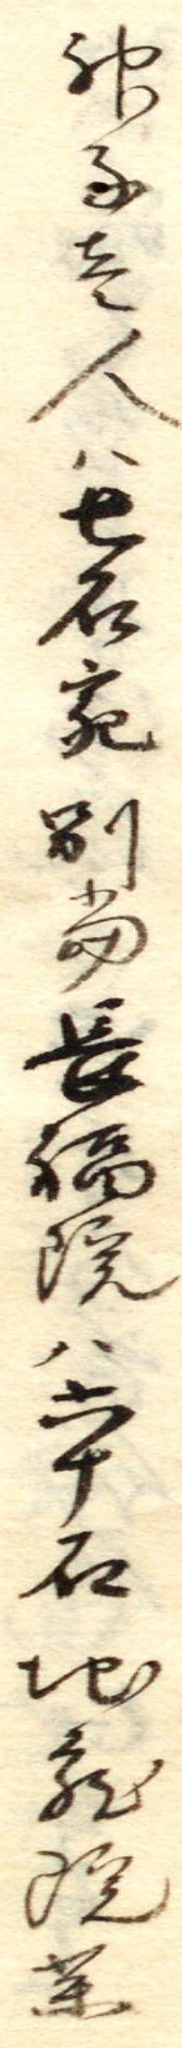神子壱人は七石宛別当長福院は六千石地蔵院薬
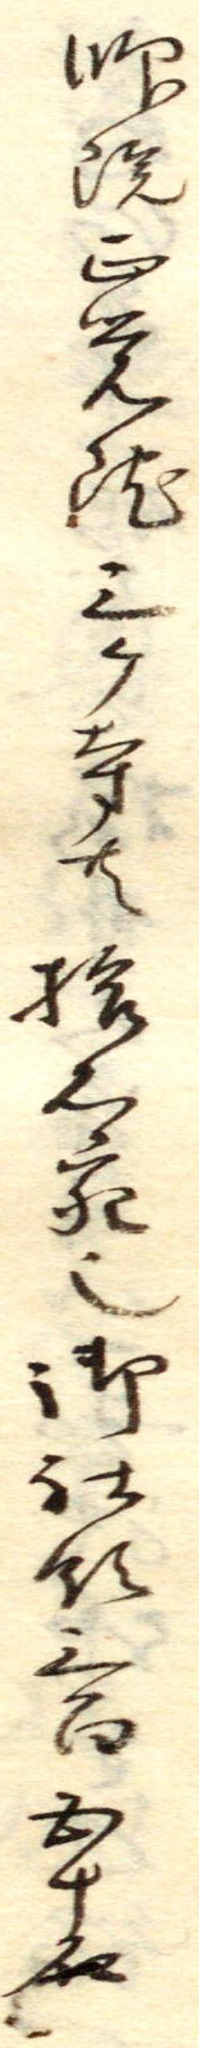師院正覚院三ヶ寺共拾石宛也御社領三百五十石

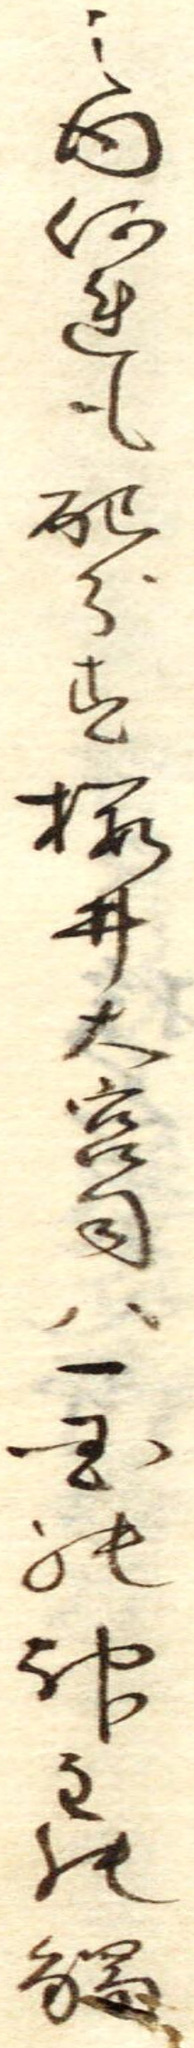之内何れも配分す桜井大宮司は一国の神主の触
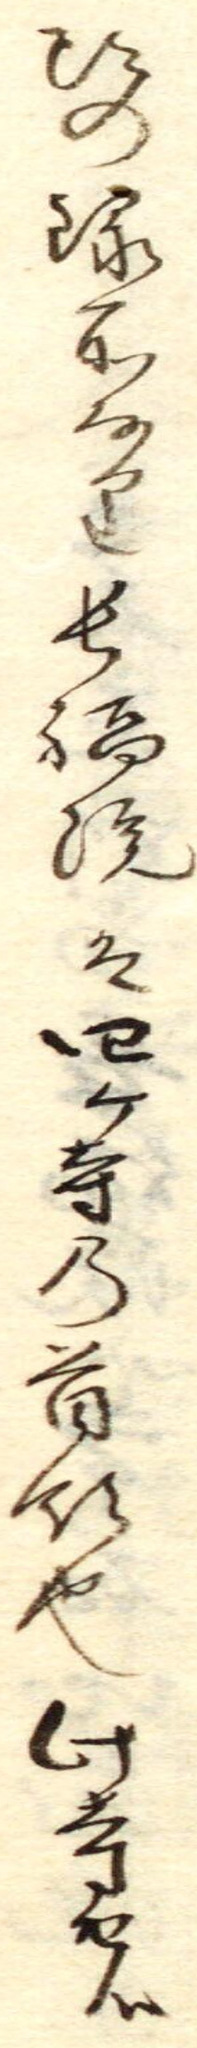頭の録所なり長福院は四ヶ寺の首領也此寺の
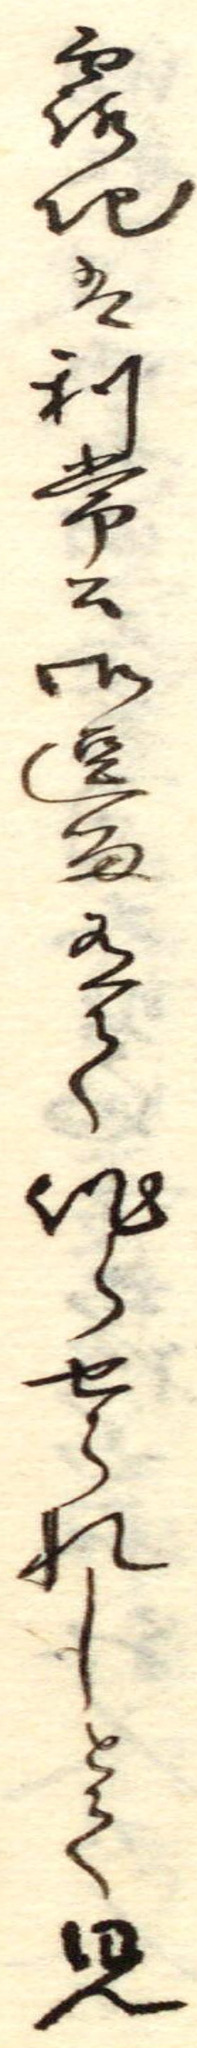露地は利常公御逗留有て作らせられしとて見
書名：能登名跡誌
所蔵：Ishikawa Prefectural Library
